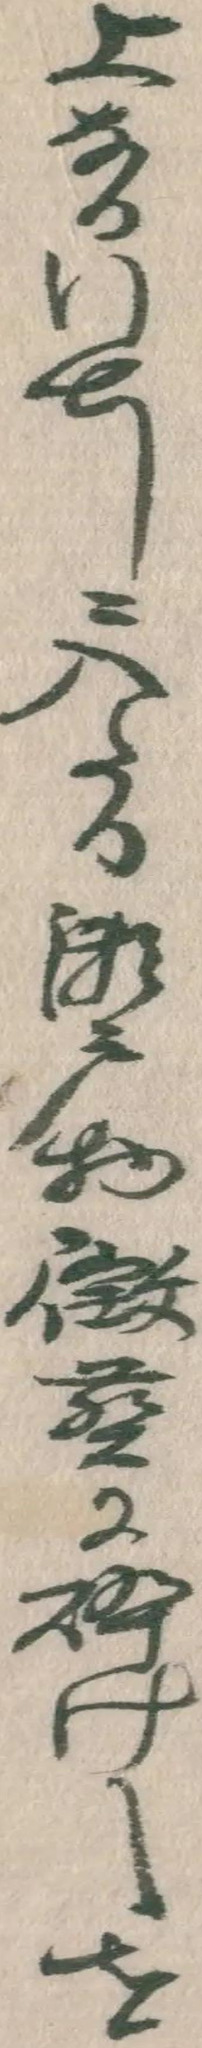上なる引出しに入たる瀬戸物微塵に砕けしを
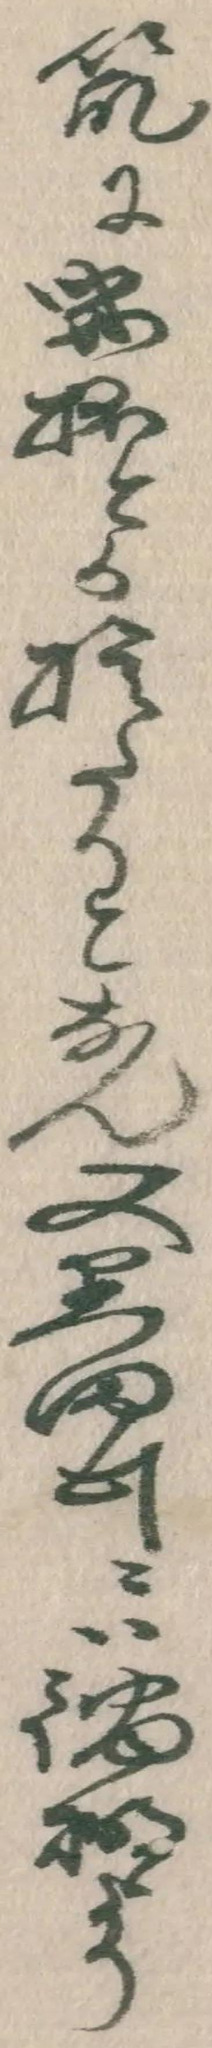笊に幾杯とか捨たりとなん又黒田氏には縮棚より

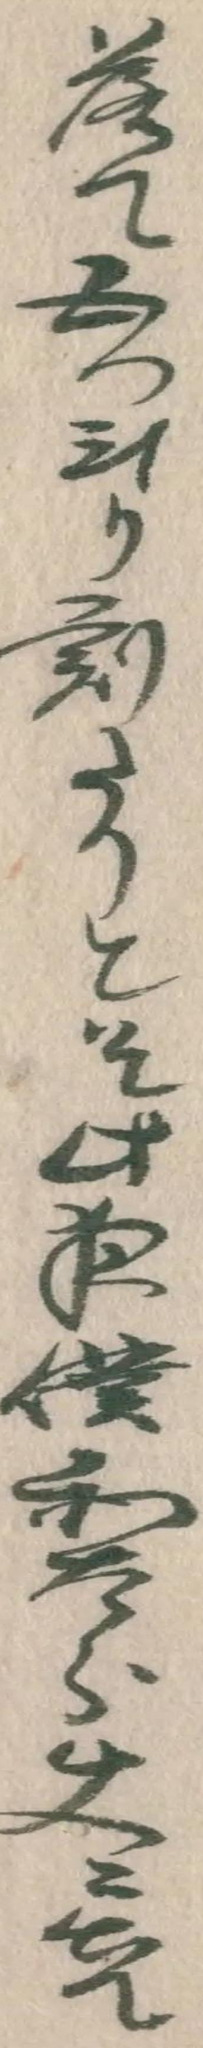落て五つ計り割たりとそ此夜僕和太郎丈に出て
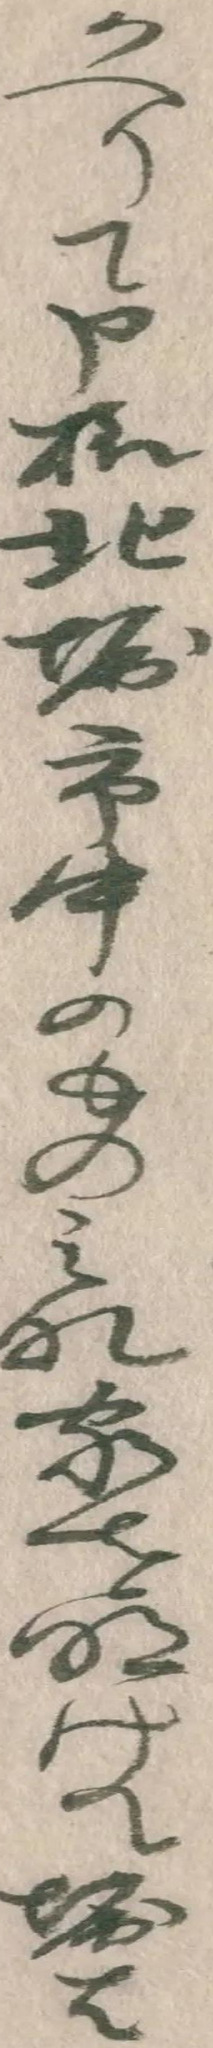かへりて申様北堀市中のものみな家を明けて堀は
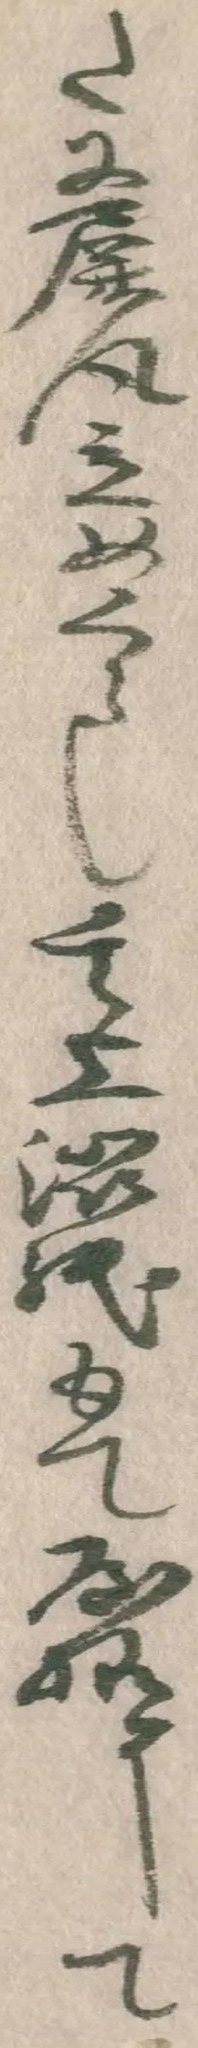たに屏風立めくらし其上渋紙もて屋根として
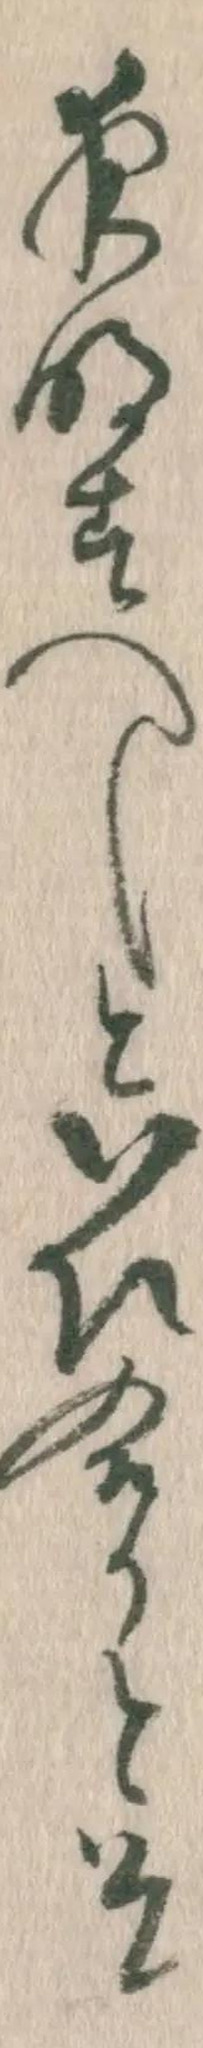夜明すへしといひ合りとそ
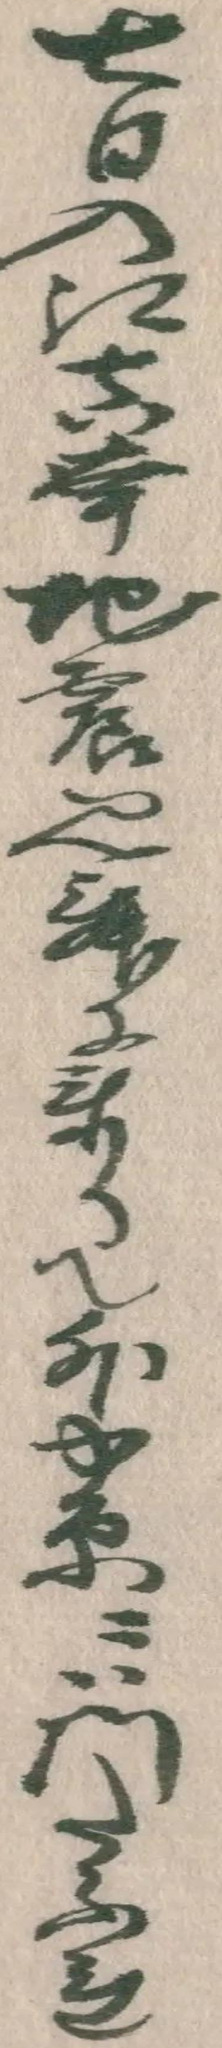七日入江真幸地震見舞に参りて外中原には門たふれ
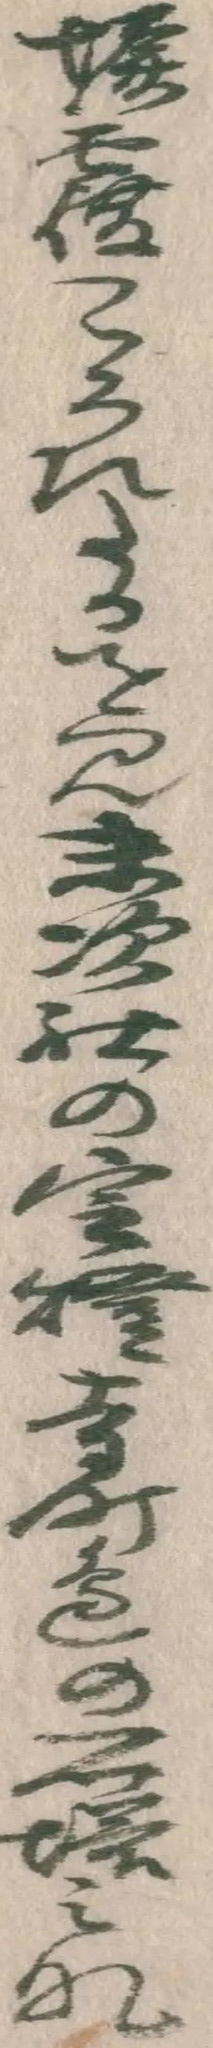塀覆ころひたるを見末次社の宝燈寺町辺の石塔みな
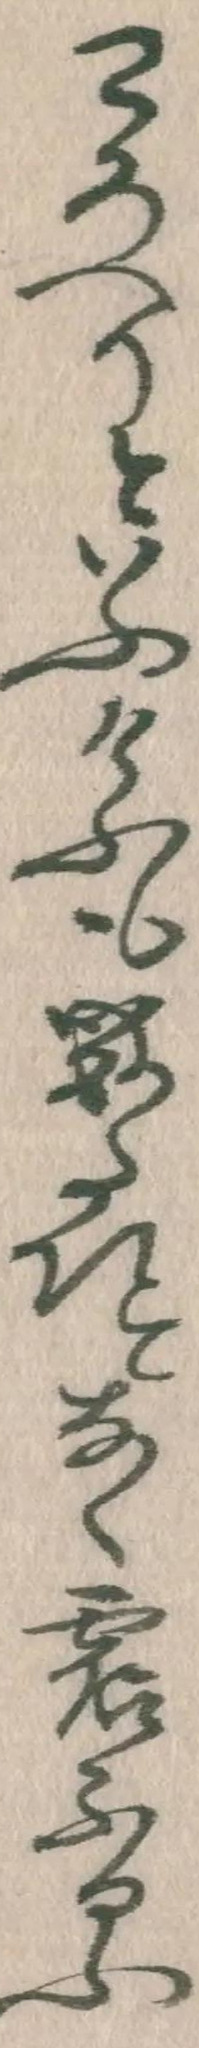ころへりといふけふも幾たひとなく震ふるふ
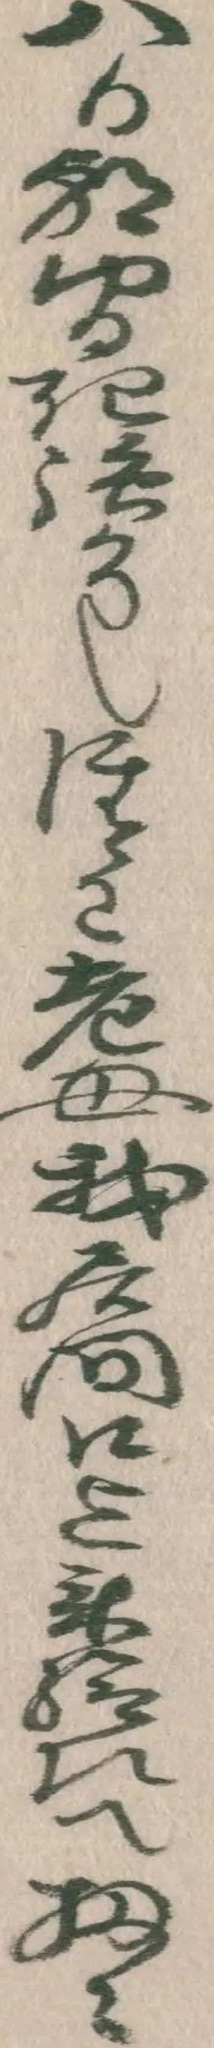八日朝ゆるき強かりしほとに老母我居間口迄参給ひて扨々
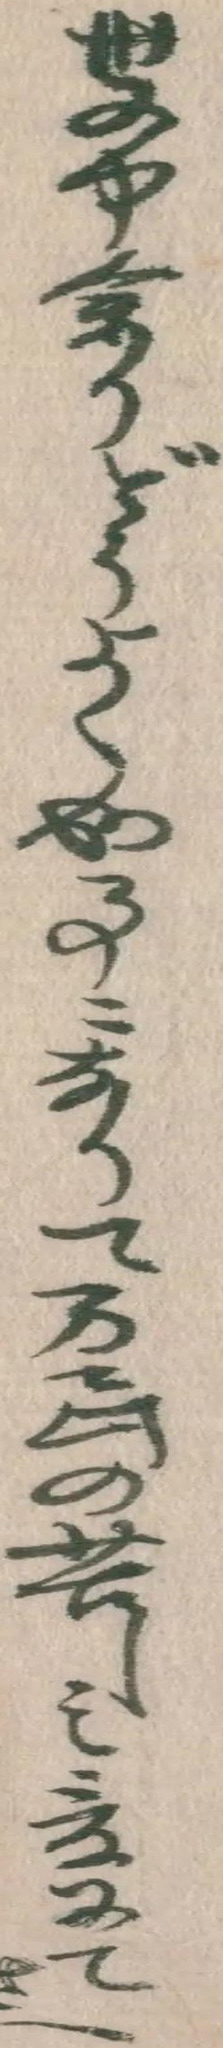世の中余りどうよく成事になりて万民の苦しみ爰にてさへ
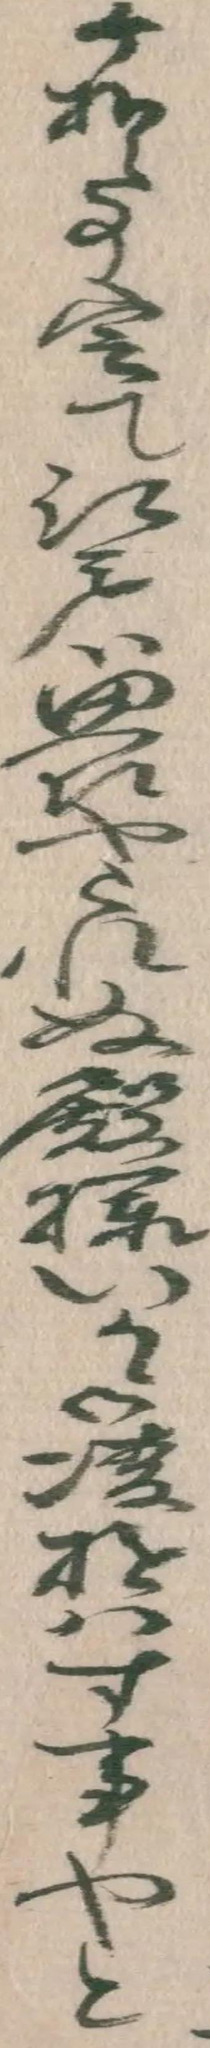ケ様之事定て江戸は思ひやられぬ殿様いかゝ御凌遊はす事やと
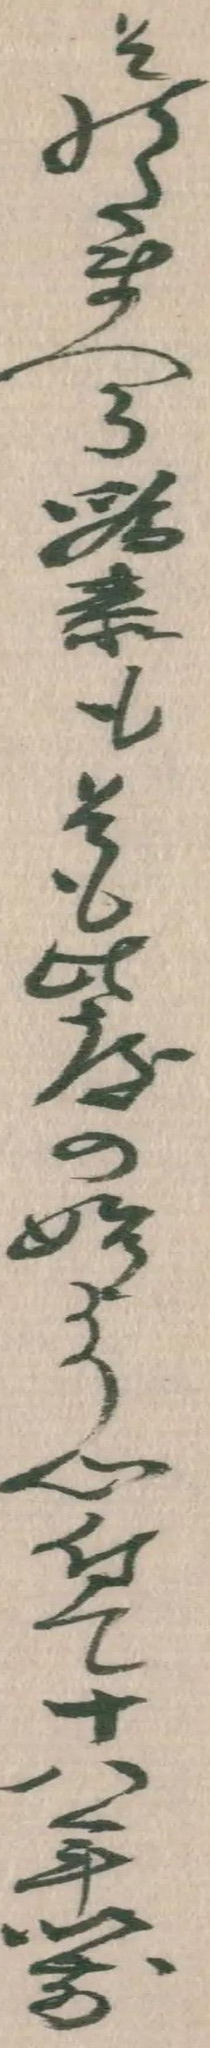そのたまへる為泰もそも此度の始より心付て十八年以前
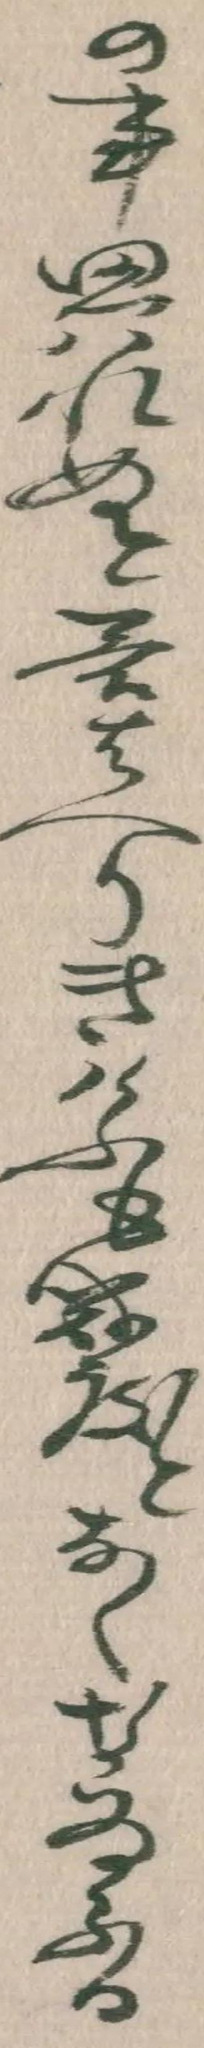の事思はれぬと答はへりきけふも幾度となくなゐふる
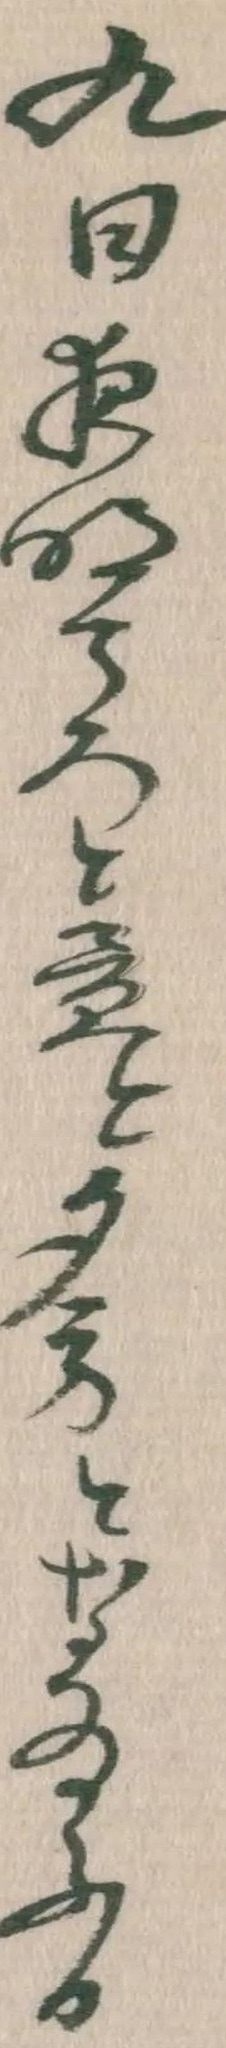九日夜明ころと昼と夕方となゐふる
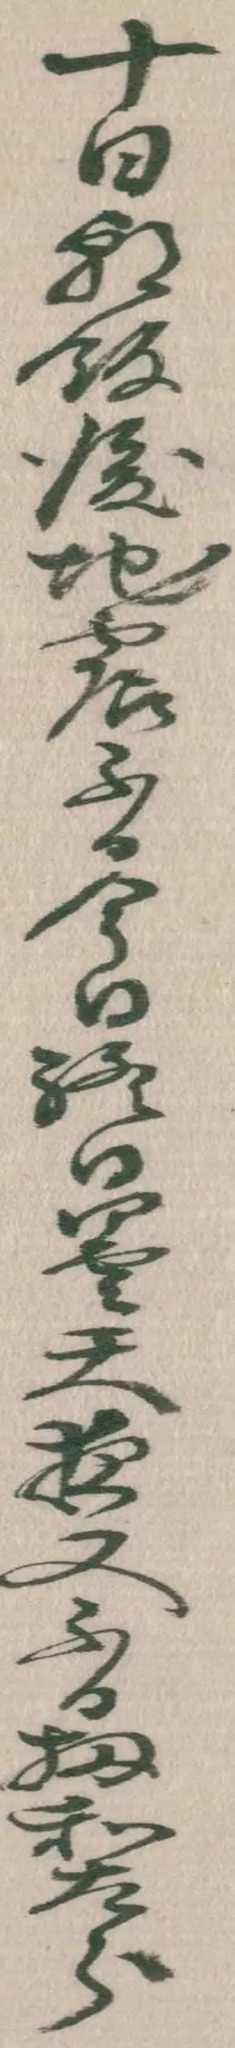十日朝飯後地震ふる今日終日曇天夜又ふる扨和太郎
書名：出雲紀行. 20
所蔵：国立国会図書館 National Diet Library, JAPAN
